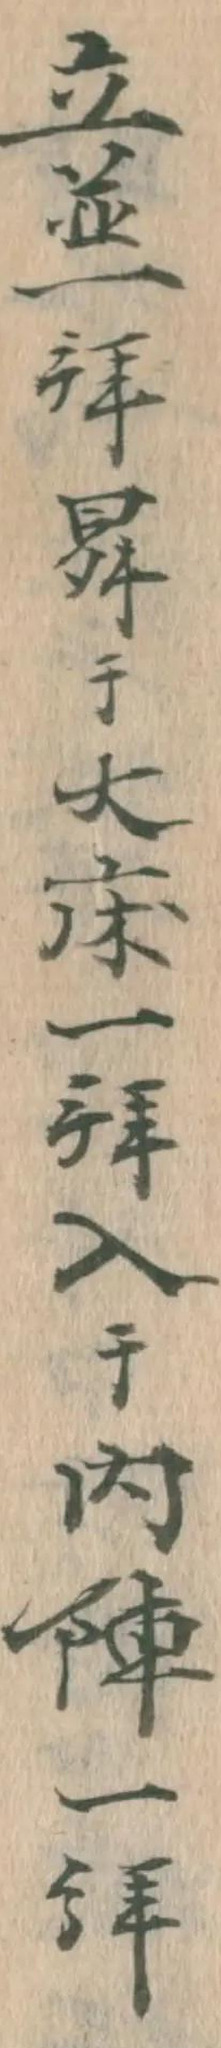立並一拝昇于大床一拝入于内陣一拝
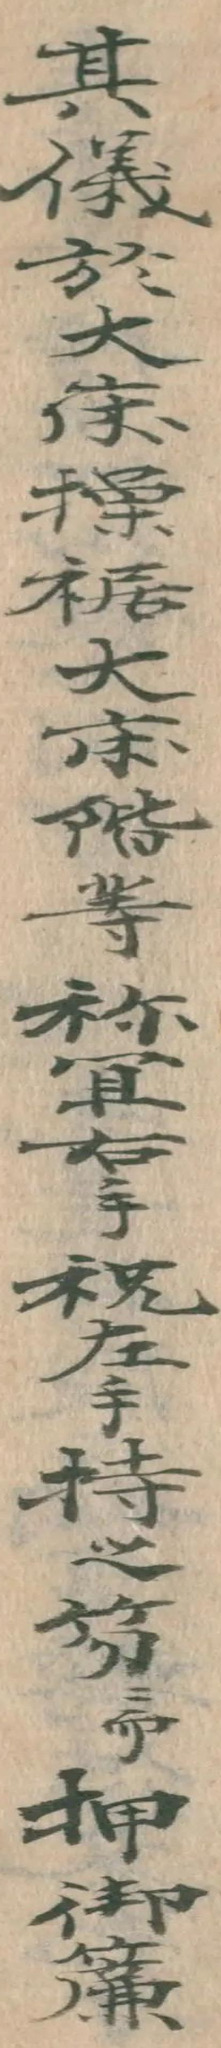其儀於大床操裾大床階等祢宜右手祝左手持之笏ニ而押御簾
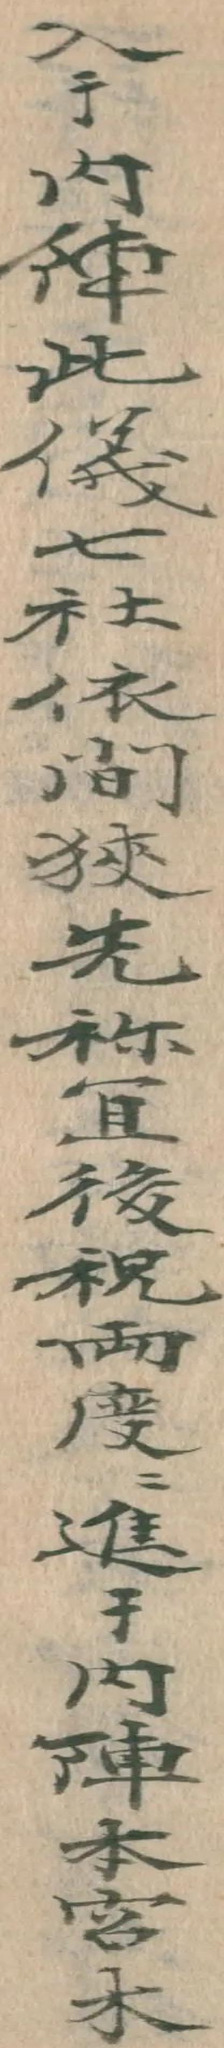入于内陣此儀七社依間狭先称宜後祝両度ニ進于内陣本宮木
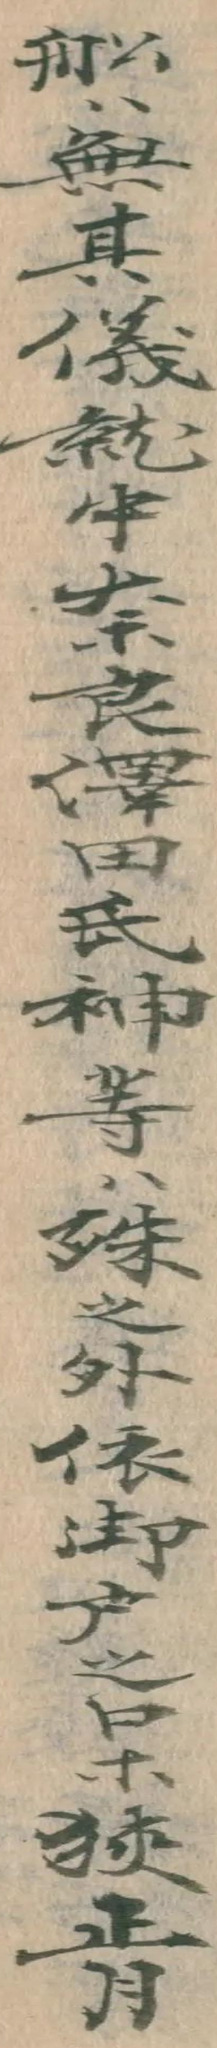船ハ無其儀就中奈良沢田氏神等ハ殊之外依御戸之口等狭正月
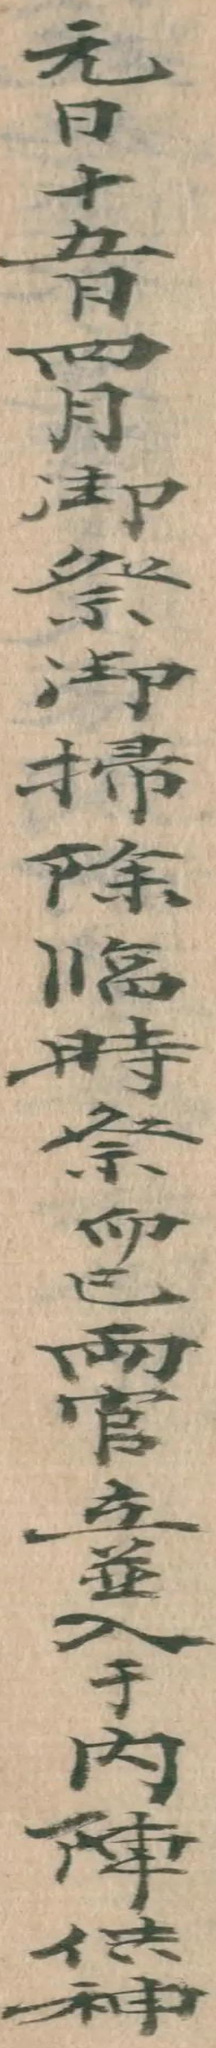元日十五日四月御祭御掃除臨時祭而巳両官立並入于内陣供神
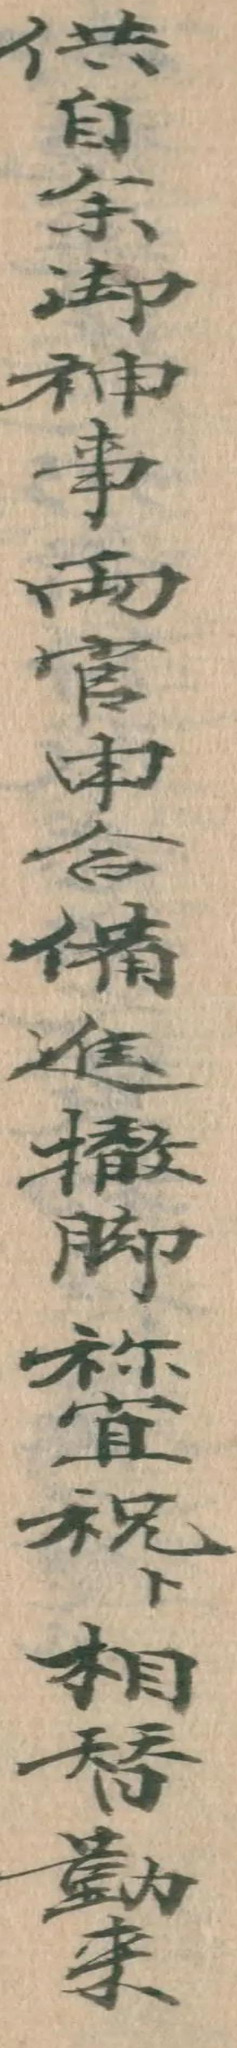供自余御神事両官申合備進撤脚称宜祝ト相替勤来
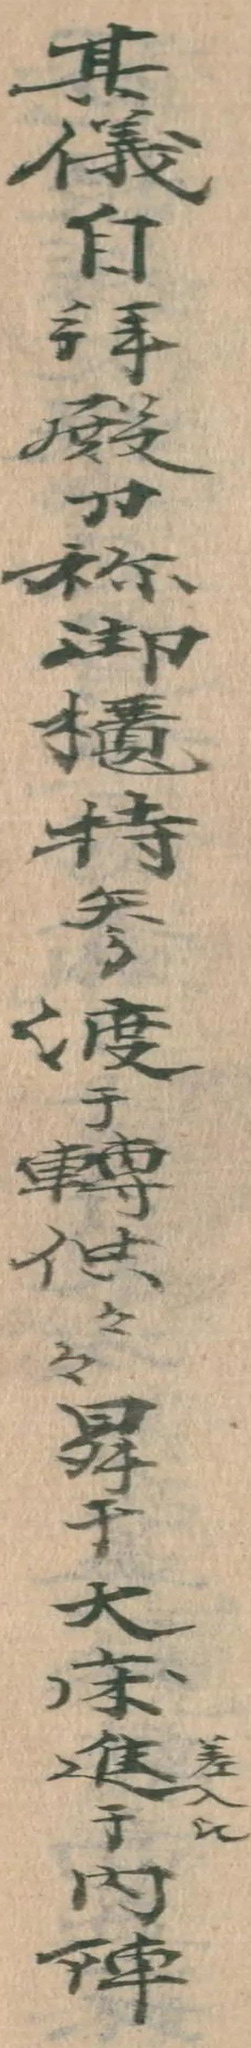其儀自拝殿刀祢御櫃持参渡于転供々々昇于大床進于内陣
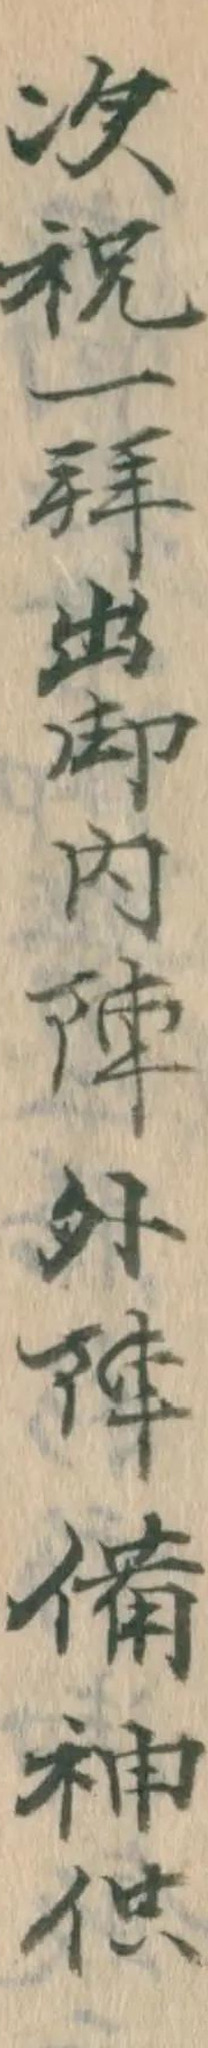次祝一拝出御内陣外陣備神供

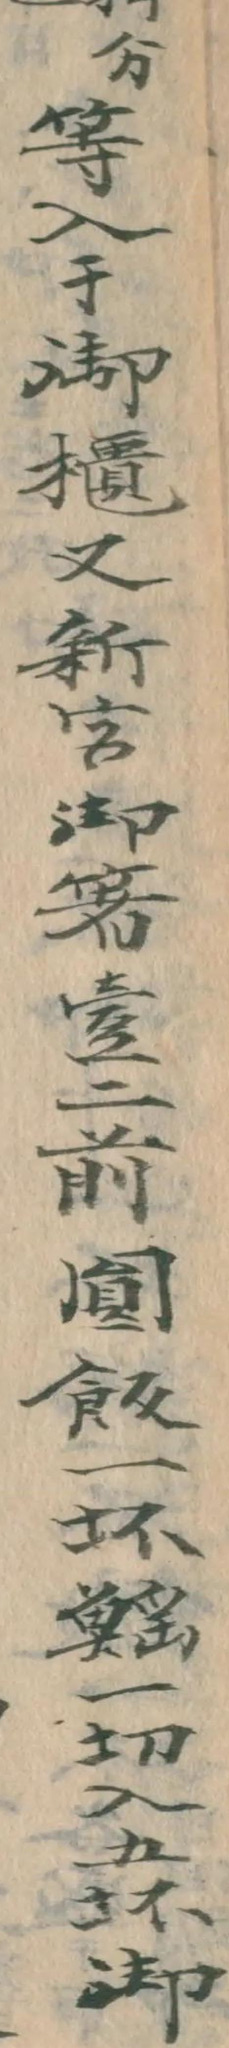料分也等入于御櫃又新宮御箸台二前円飯一坏鰩一切入五坏御
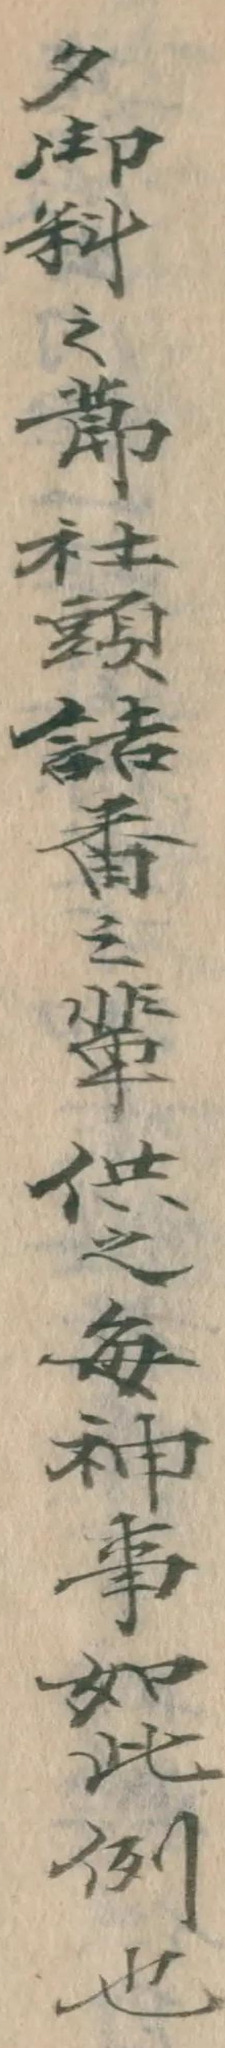タ御料之節社頭詰番之輩供之毎神事如此例也
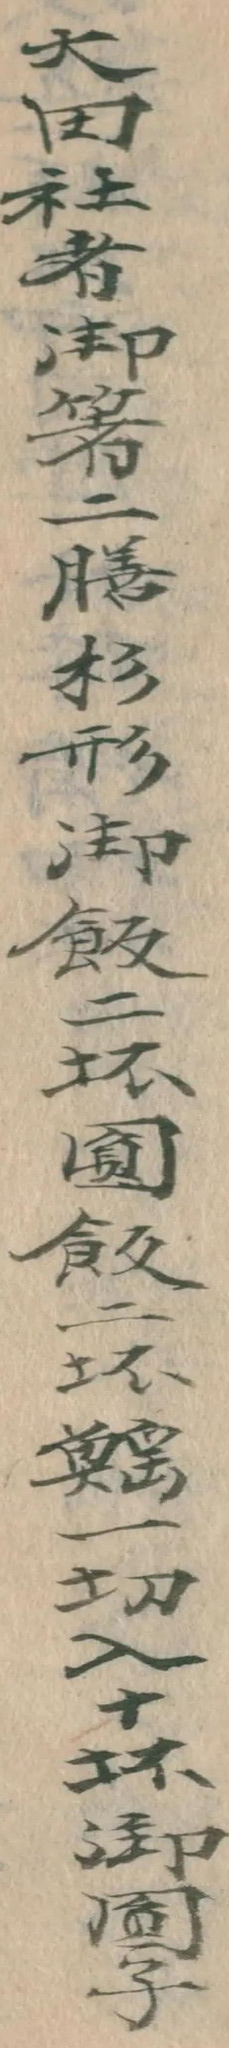大田社者御箸二膳杉形御飯二坏円飯二坏鰩一切入十坏御円子
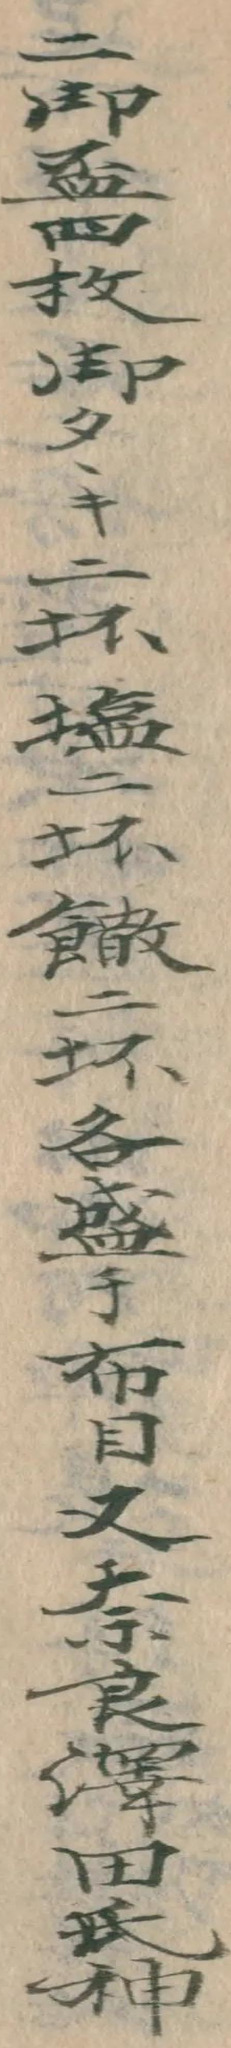二御盃四枚御タヽキ二坏塩二坏饊二杯各盛于布目又奈良沢田氏神
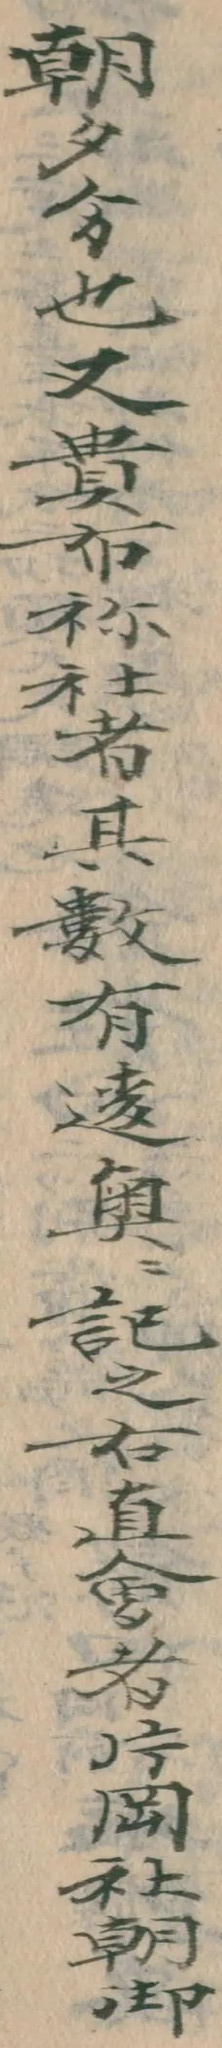朝夕分也又貴ふね社者其数有違奥ニ記之右直会者片岡社朝御
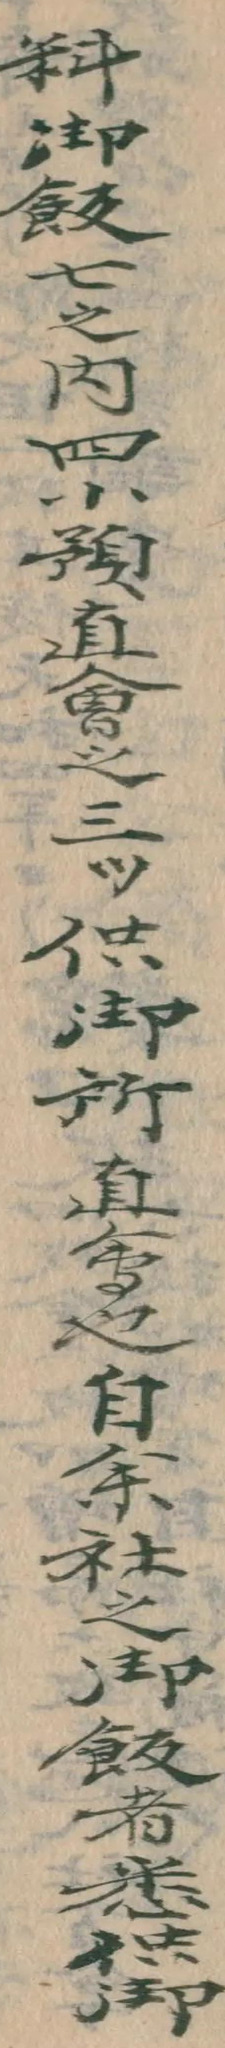料御飯七之内四小預直会之三ツ供御所直会也自余社之御飯者悉供御
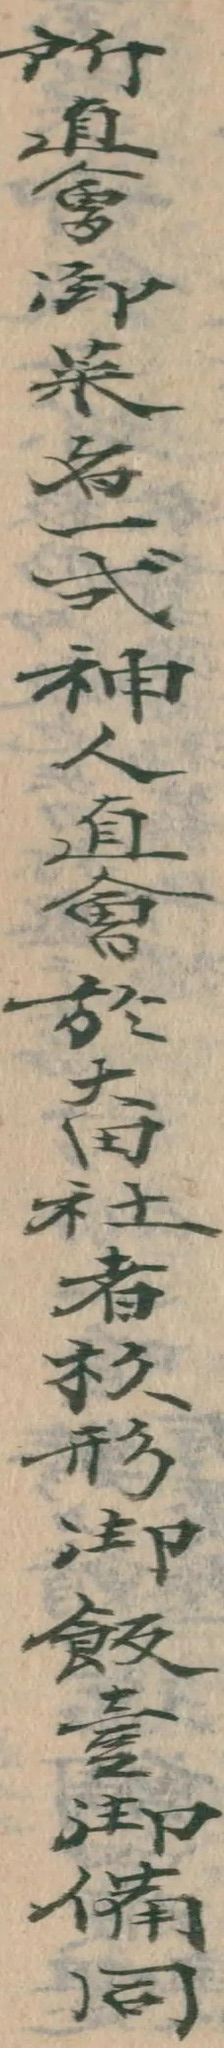所直会御菜者一式神人直会於大田社者杉形御飯壱御備同
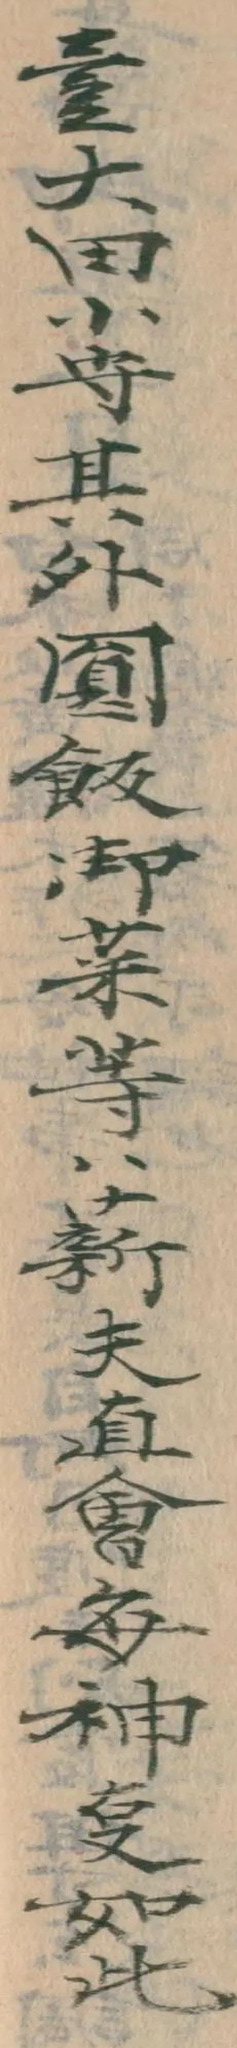壱大田小守其外円飯御菜等ハ薪夫直会毎神事如此
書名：賀茂社記録. 第9冊
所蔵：国立国会図書館 National Diet Library, JAPAN
